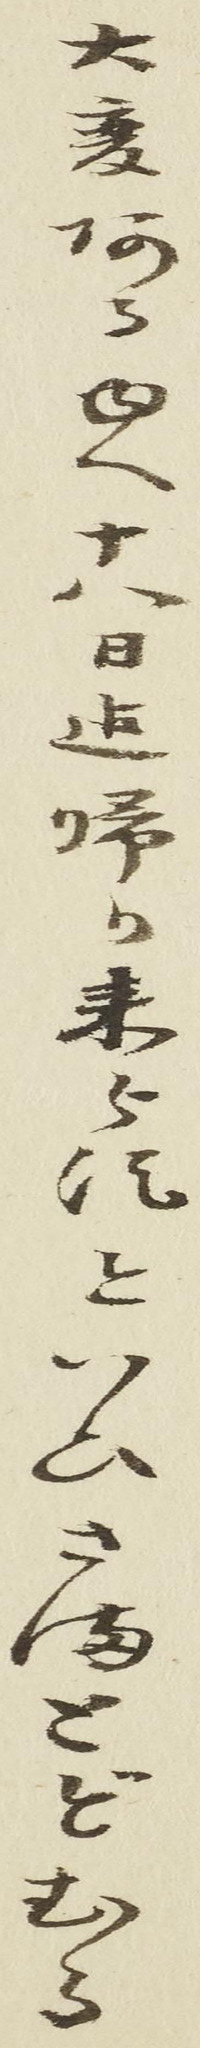大変なるゆへ十八日迄帰り来らすといひさまとどめる
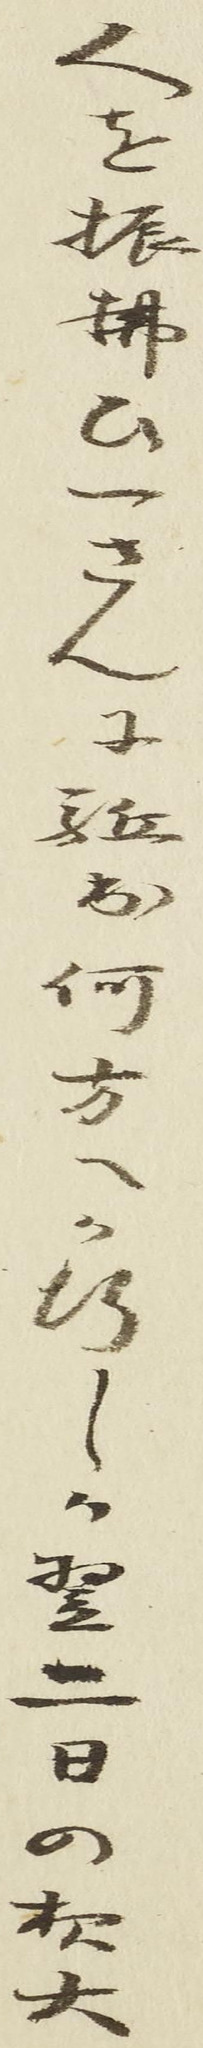人振拂ひて一さんに駈出何方へか行しか翌二日の夜大
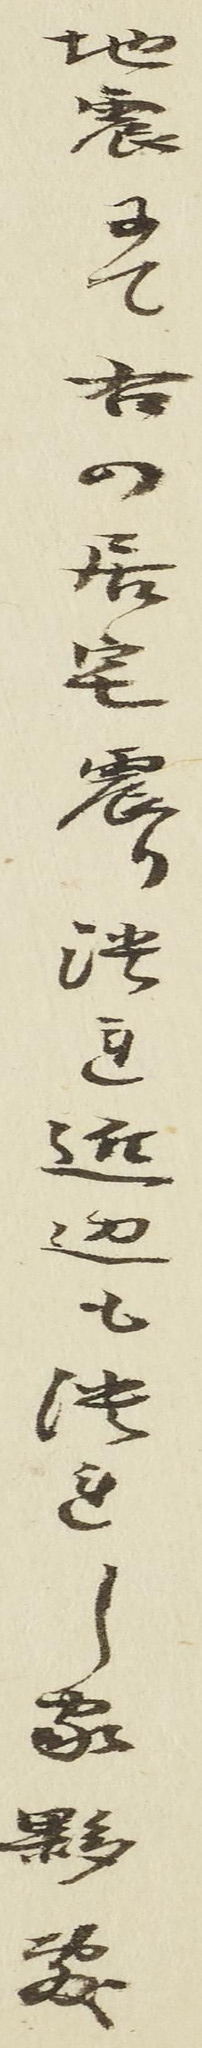地震にて右の居宅震り潰れ近辺も潰れし家夥敷
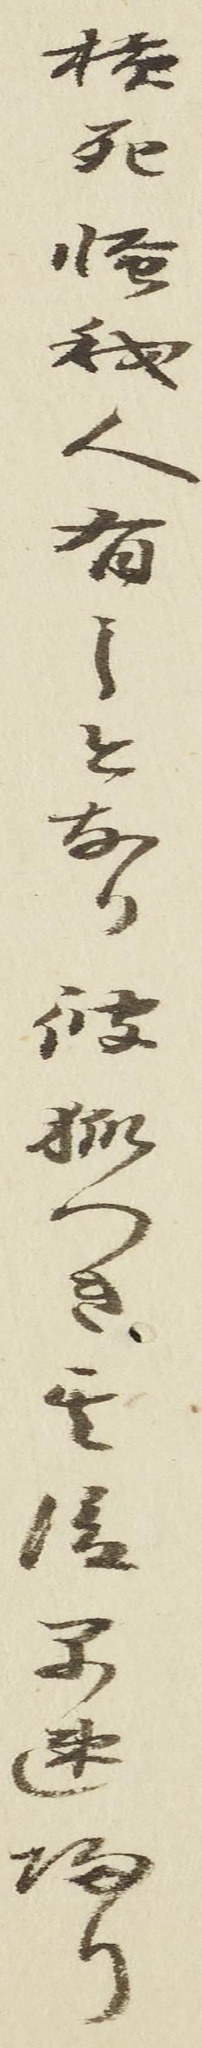横死怪我人有しとなり彼狐つき其後早速帰り
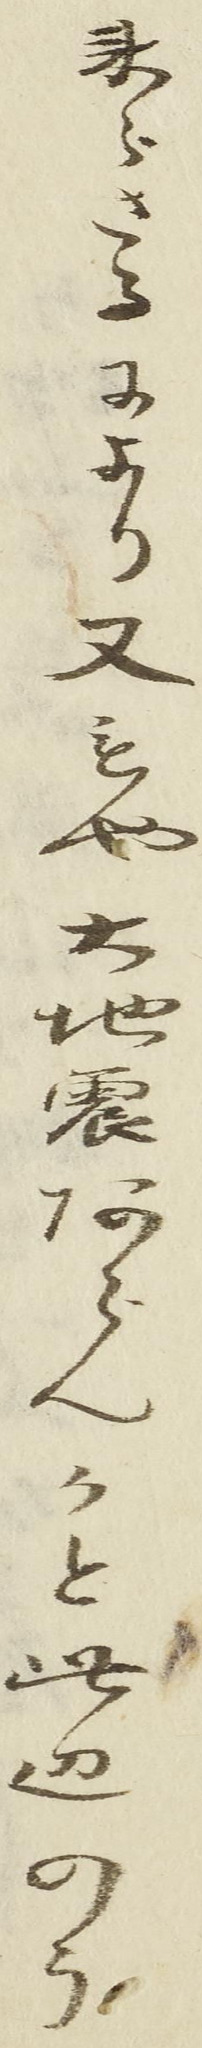来らさるにより又もや大地震ならんかと此辺のう
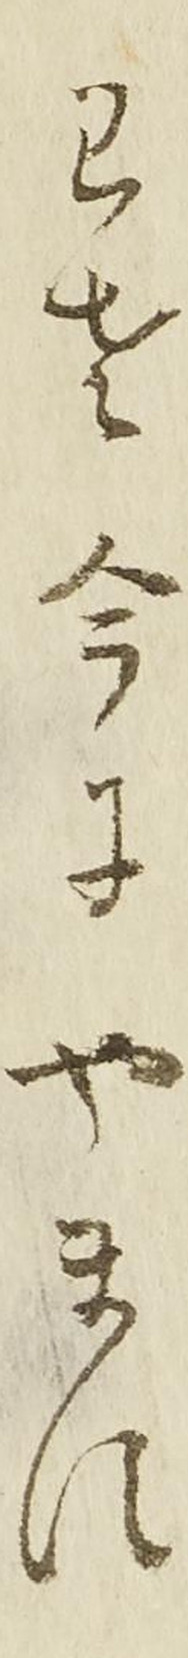わさ今にやます

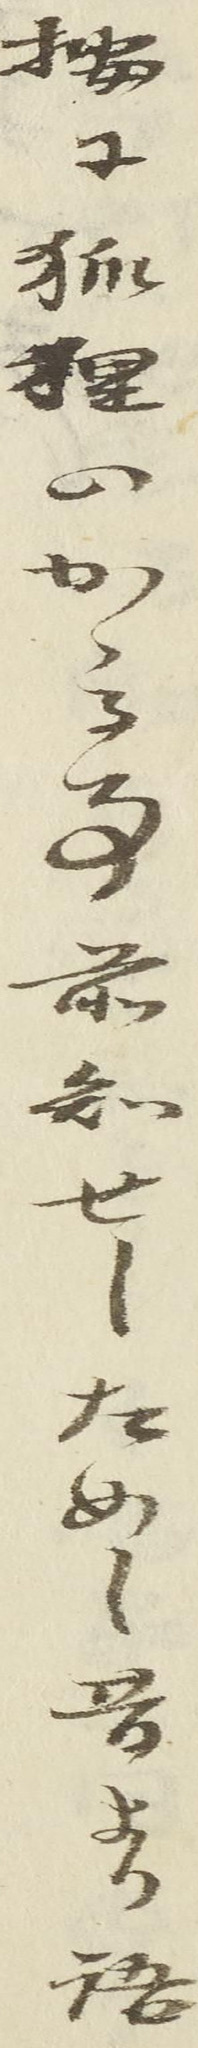按に狐狸のかゝる事前知せしためし昔より語
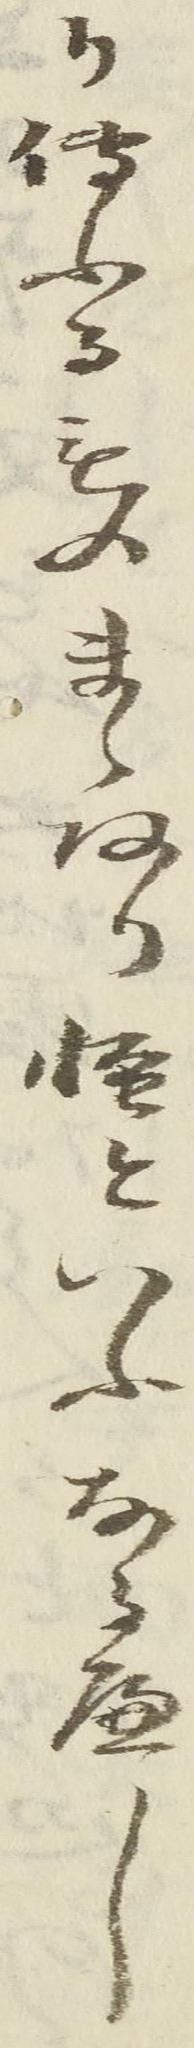り伝ふるものまゝあり怪といふなるへし
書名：那為の後見艸　全
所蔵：東京大学地震研究所図書室 Earthquake Research Institute Library, The University of Tokyo, JAPAN
